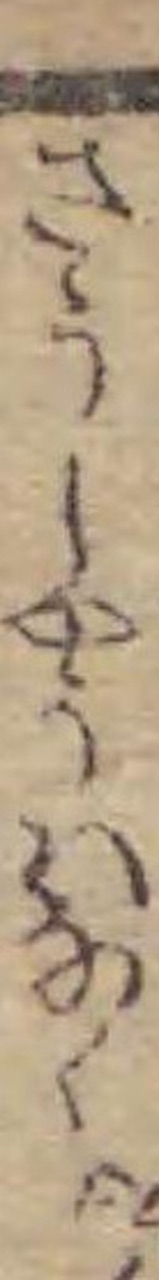さうしやうはなく
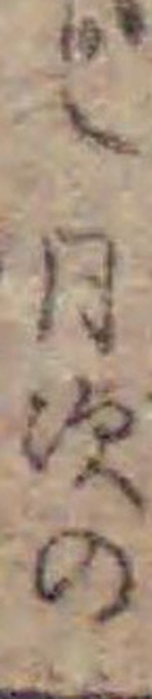月次の
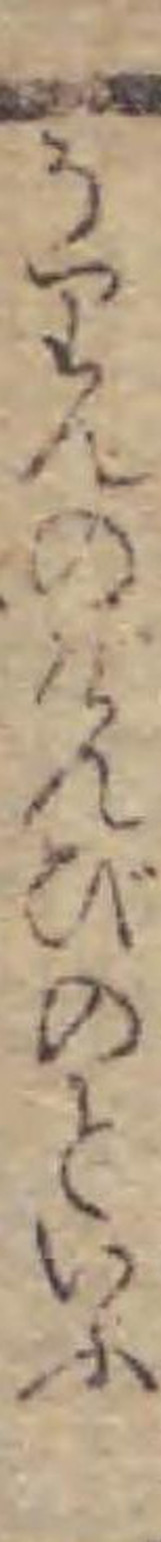かりんのげんびのといふ
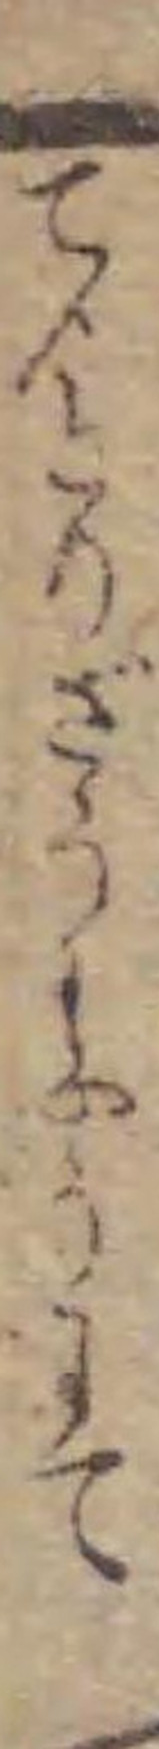てんとりざうしやうにて
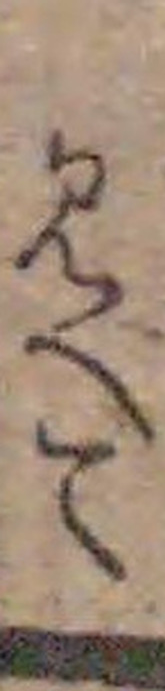見へて
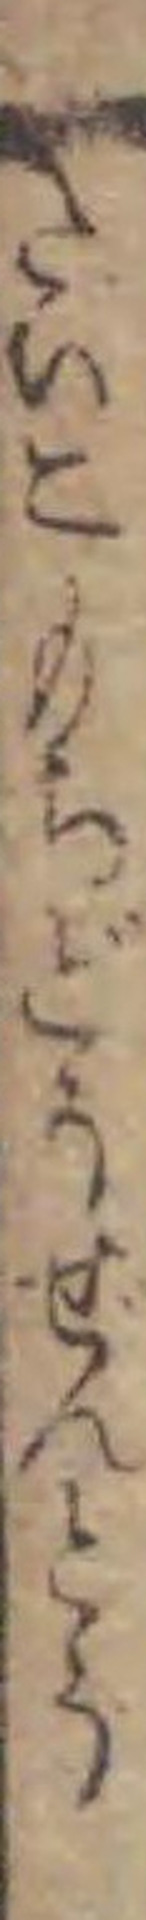たいこもちどうぜんとう
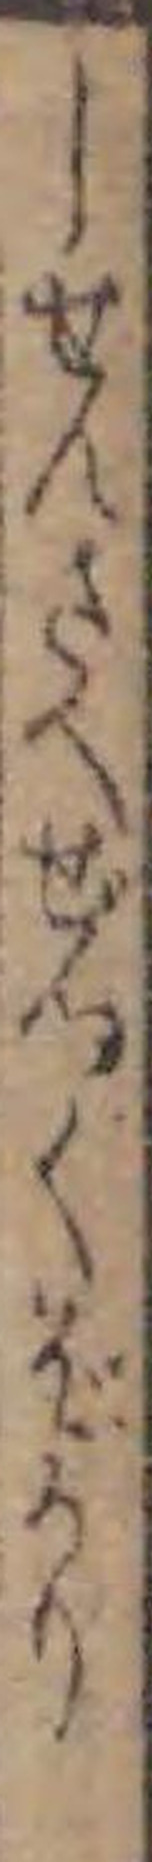しせんさへぜつくばかり
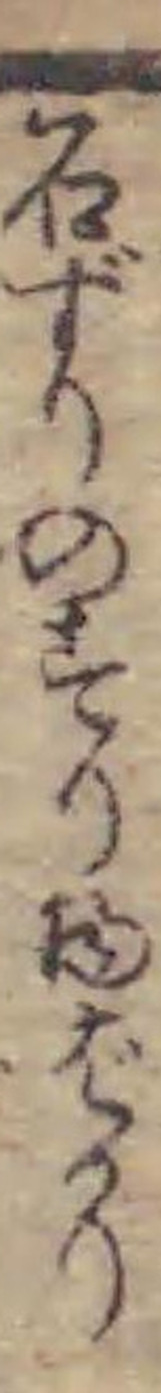石ずりのすり物ばかり
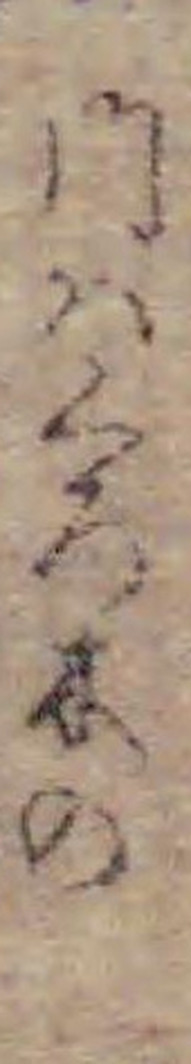門はくろ木の
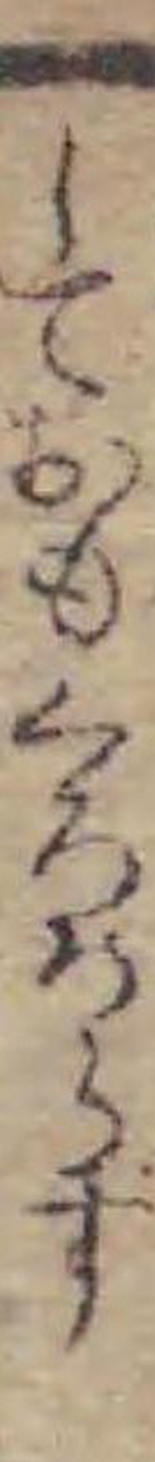しておもくろからず
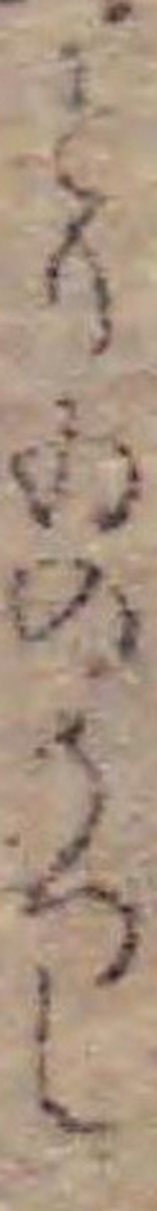とりゐのうつし
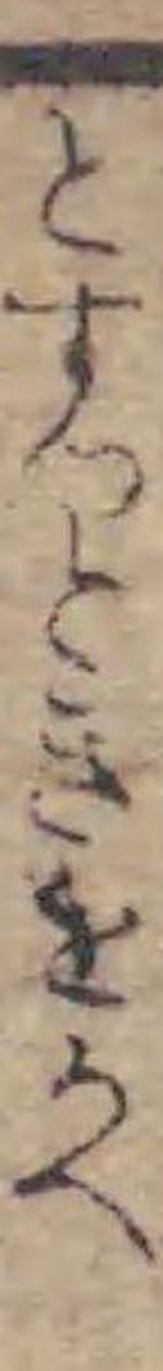とすつときをかへ
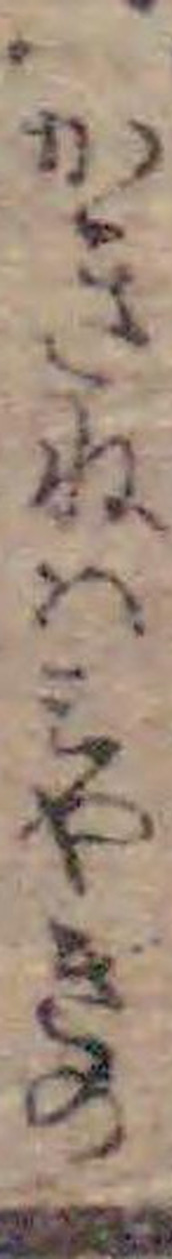かきねはみやぎの
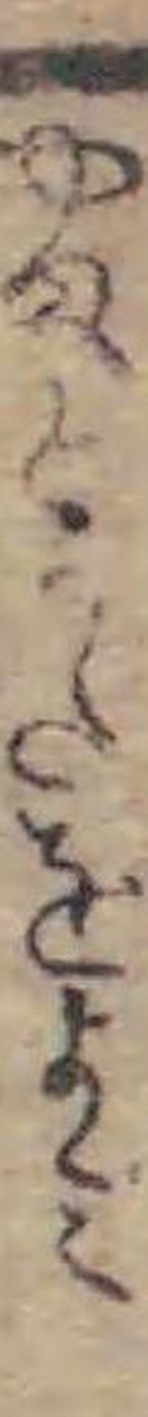やまとうたをよみ
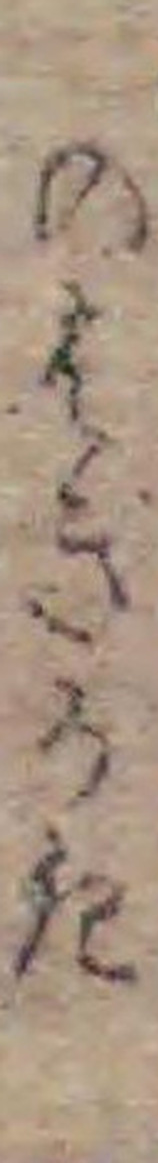のはぎかき
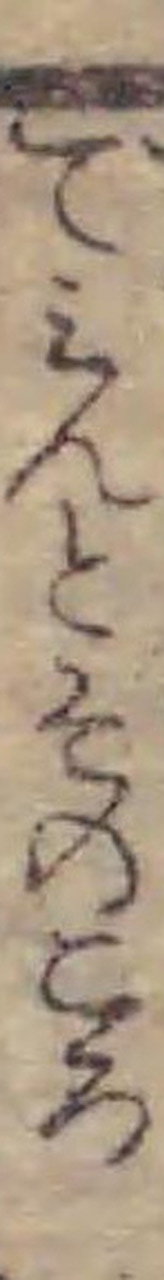てみんとそのころ
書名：此奴和日本 : 2巻
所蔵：国立国会図書館 National Diet Library, JAPAN
